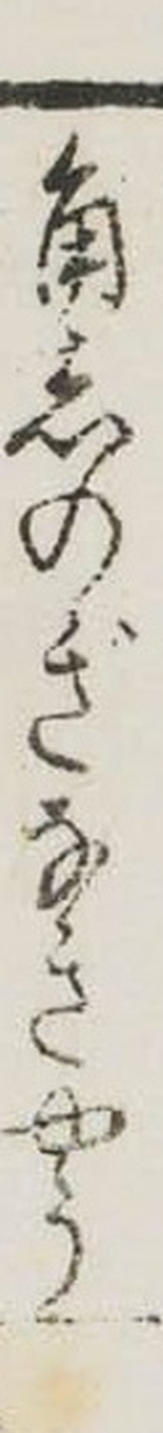角しのぎなきやう
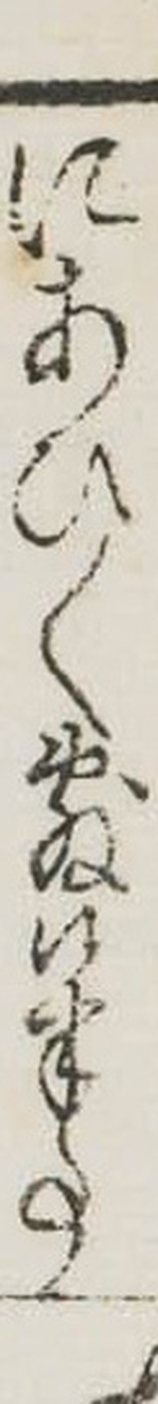にあひ〳〵敷候は事
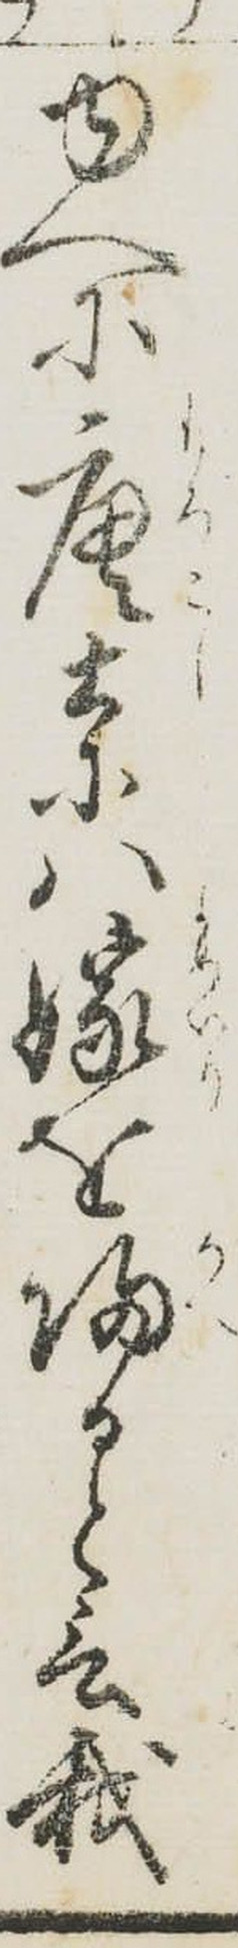ゆへに唐土には嫁を帰ると言我
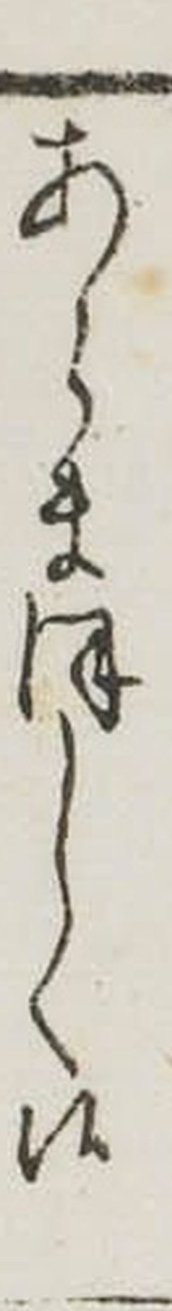あらまほしく候
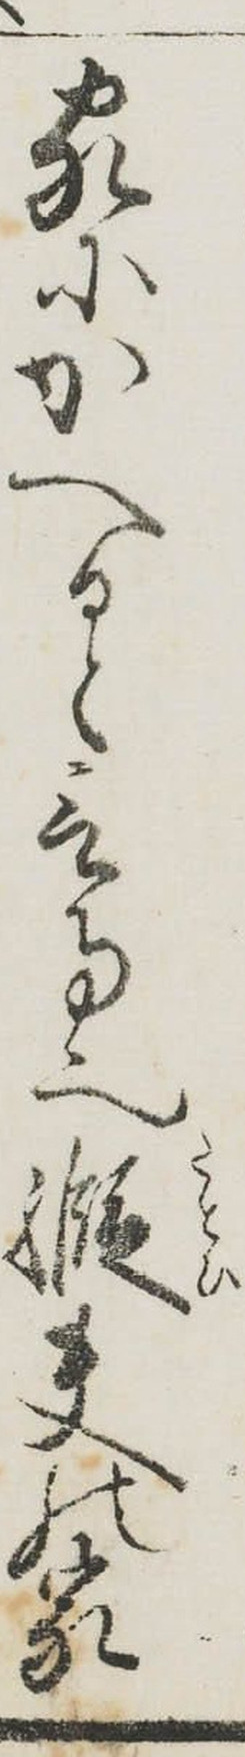家にかへると言事也縦夫の家
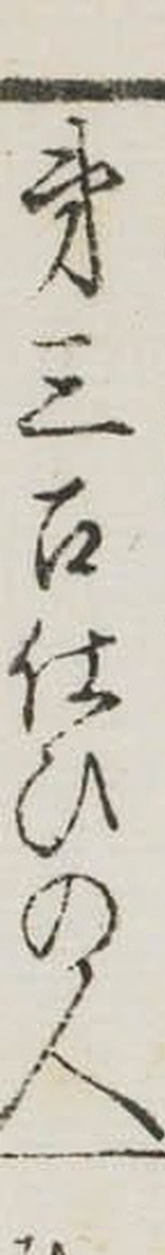第三召仕ひの人
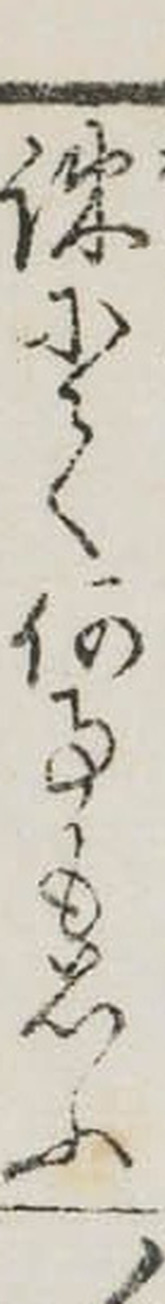疎にて何事も思ふ
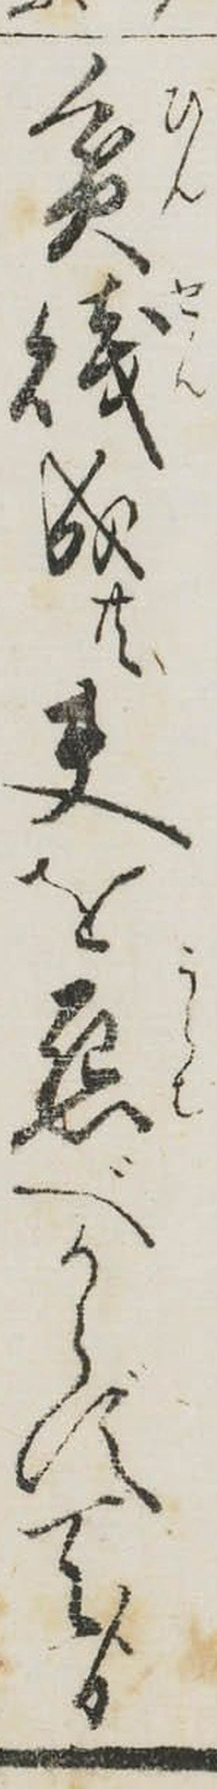貧錢成共夫を怨べからず天より
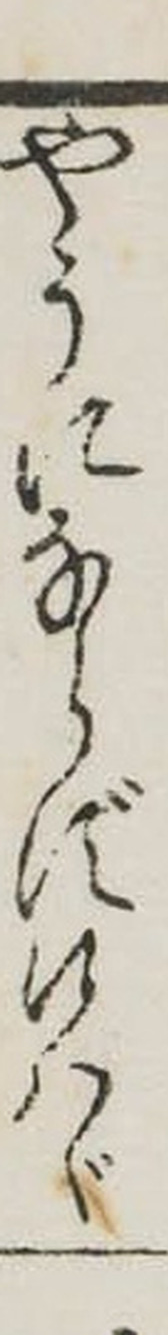やうにならず候はゞ
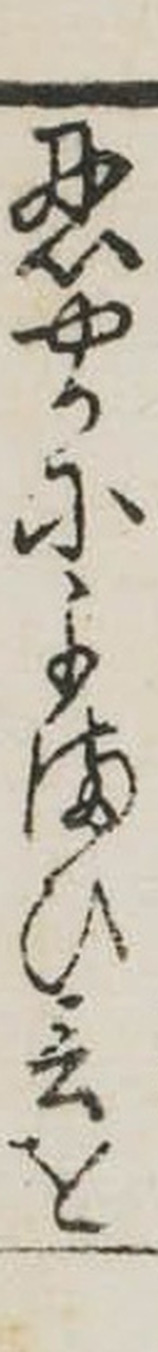忍やかによまひ言を
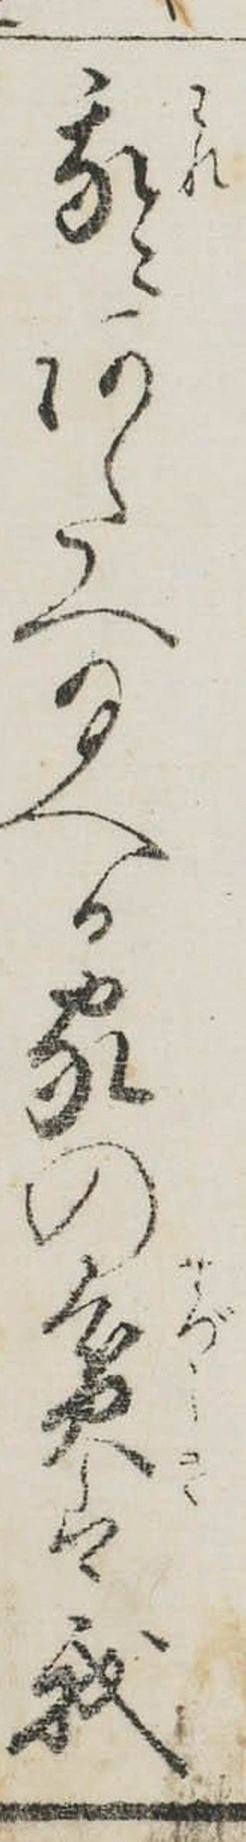我給へる家の貧は我
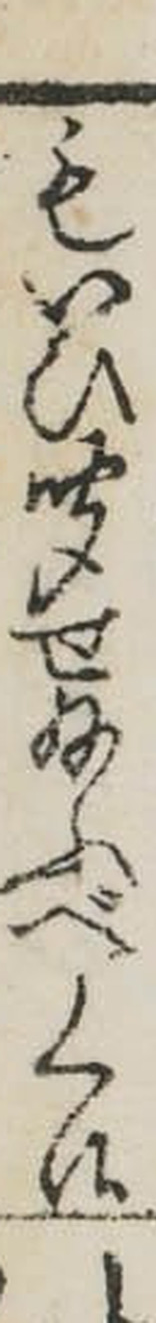もいひ聞せ給ふべく候
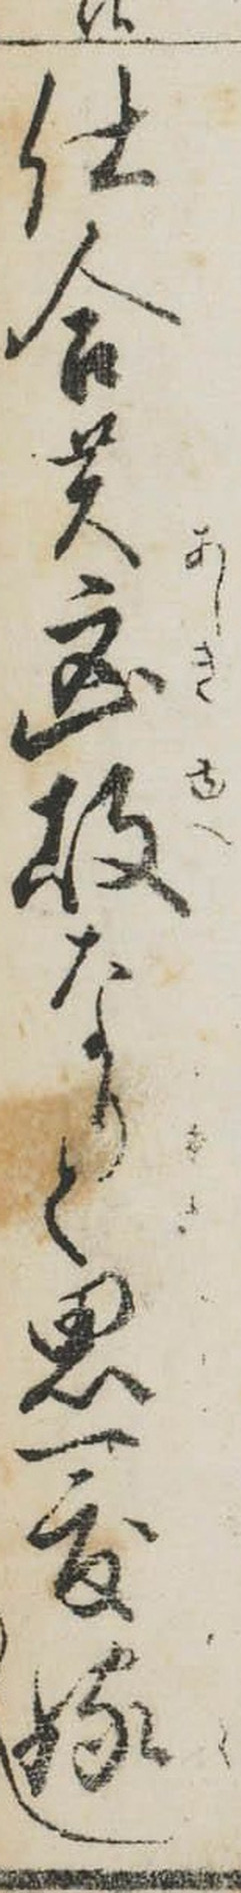仕合の凶故なりと思一度嫁し

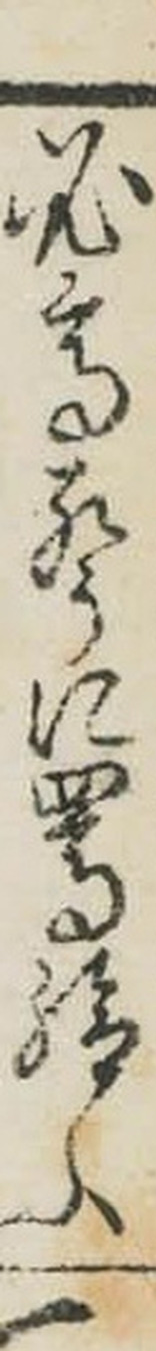必高声に罵給ふ
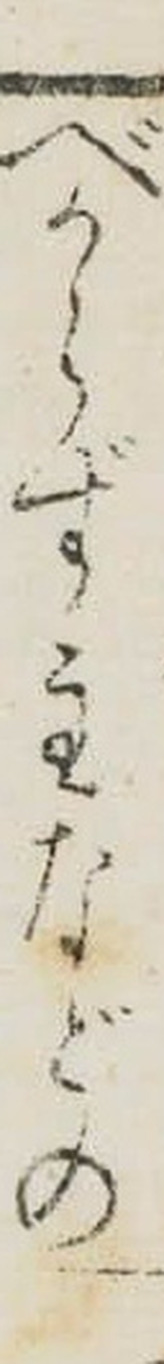べからず主などの
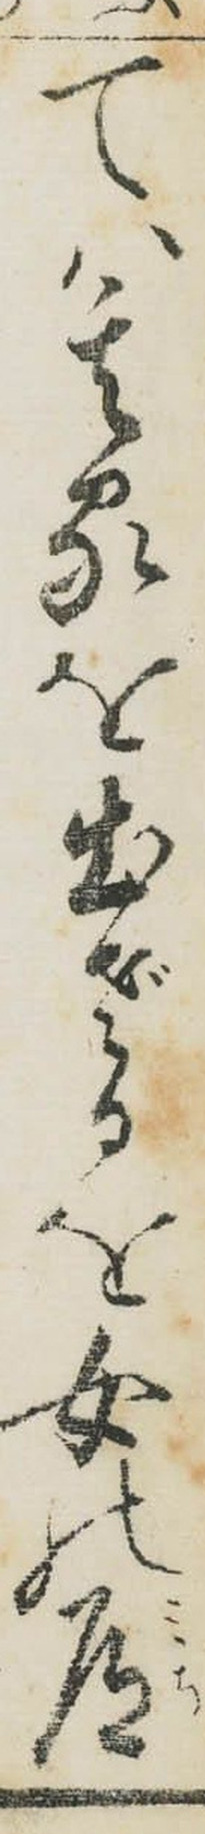ては其家を出ざるを女の道
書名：女大学
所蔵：東京学芸大学教育コンテンツアーカイブ
